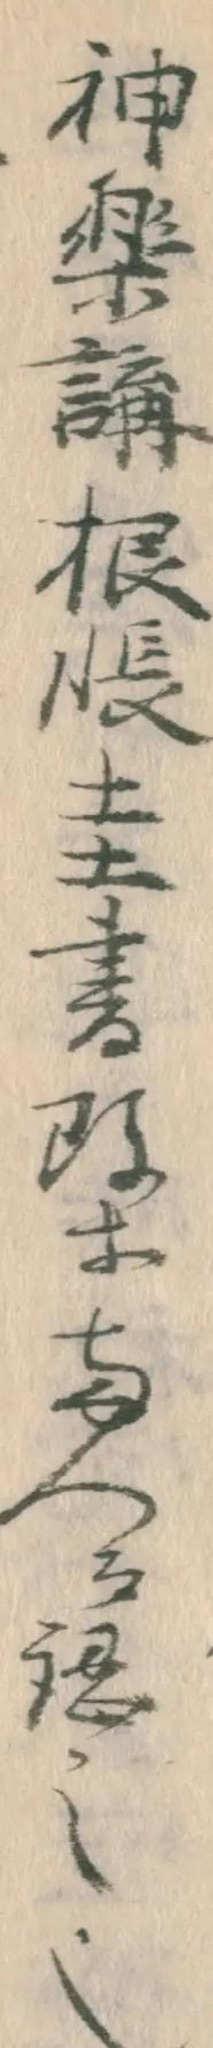神楽講根帳圭書改等両人而認之也
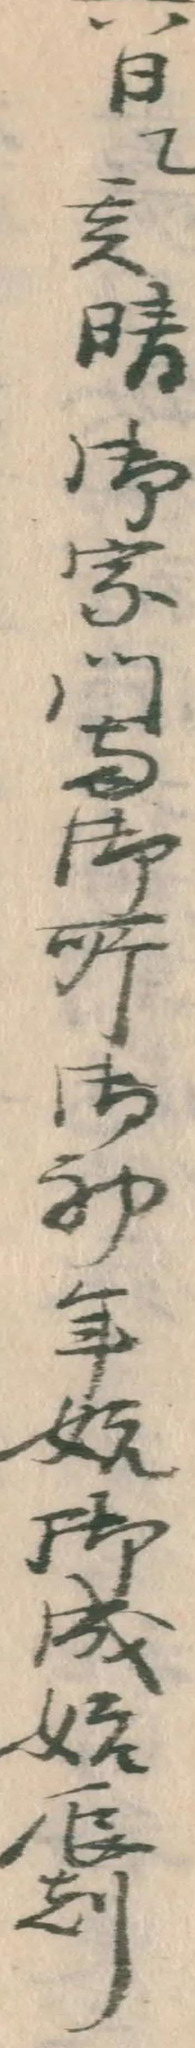六日乙亥晴御家門両御所御初年始御成始辰刻
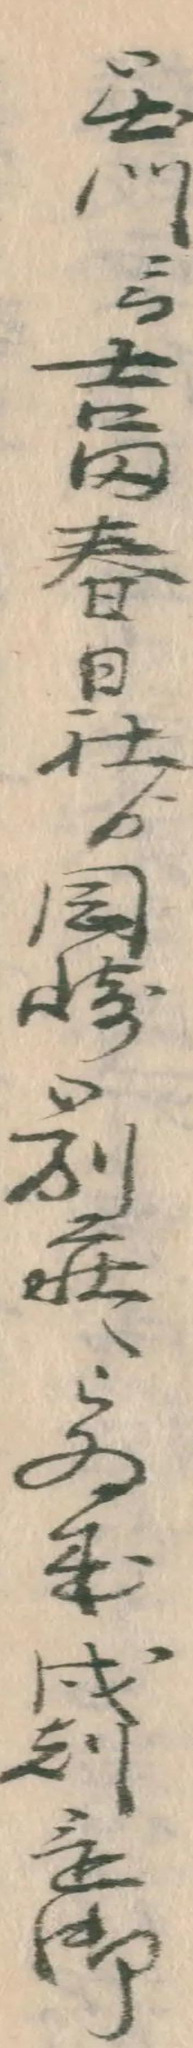御出門ニ而吉田春日社ゟ岡崎御別荘へ被為成戌刻還御
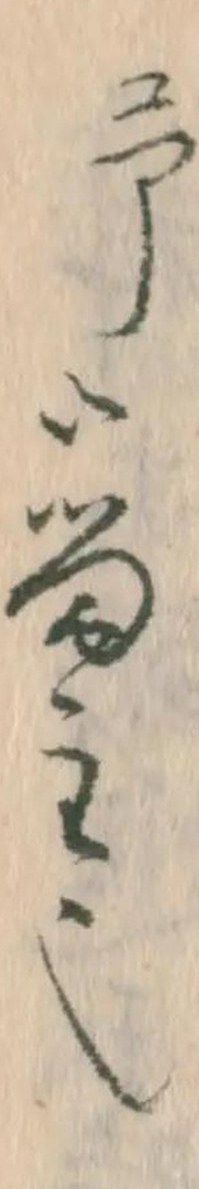予御留主也
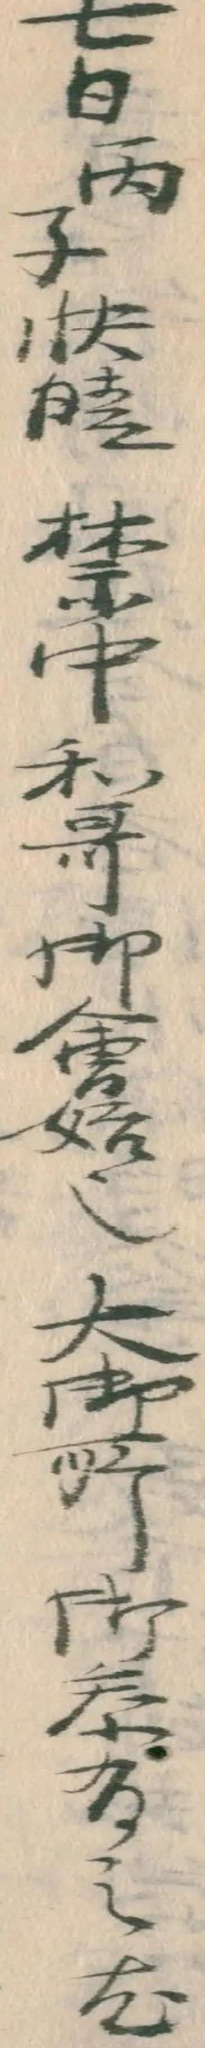七日丙子快晴禁中和歌御會始也大御所御参有之尤
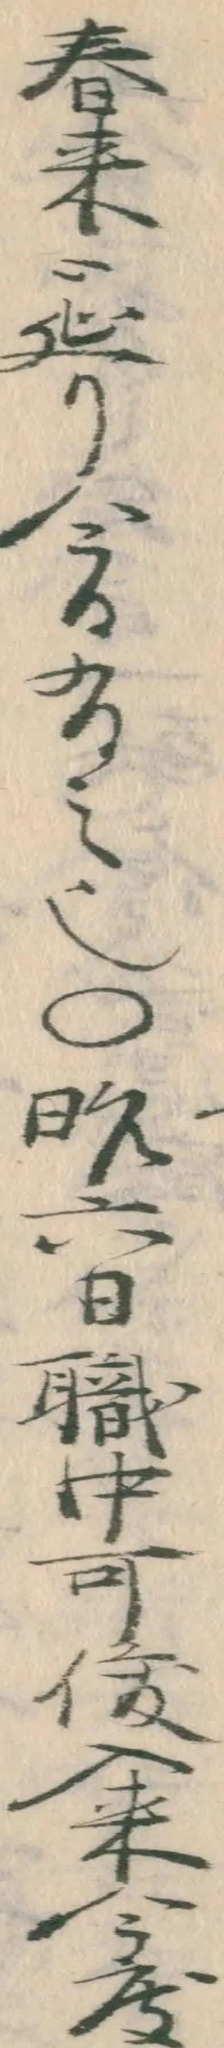春来御延引今日有之也〇昨六日職中可俊入来今度
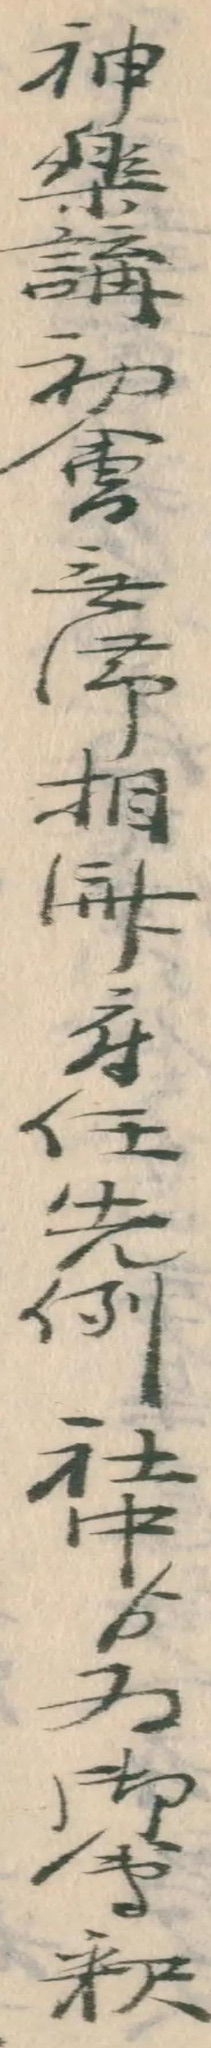神楽講初會無滞相済ニ付任先例社中ゟ為御会釈
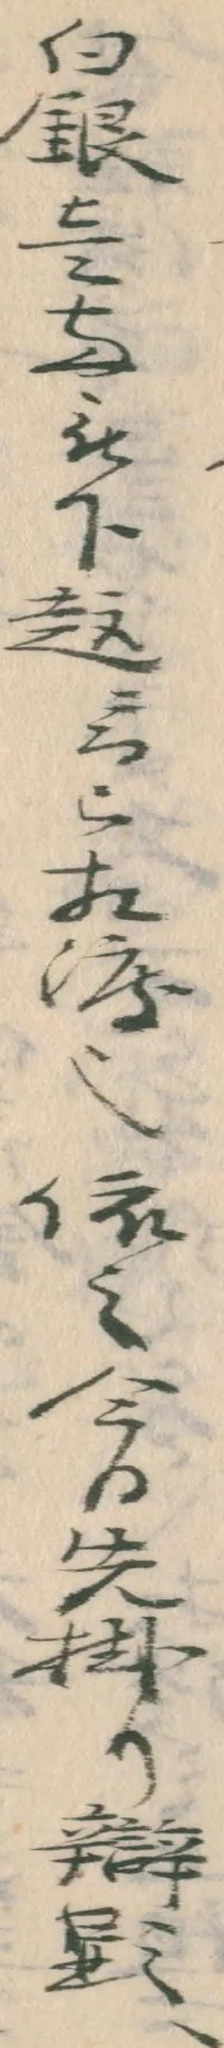白銀壱両被下趣ニ而被相渡也依之今日先掛り辨顕へ
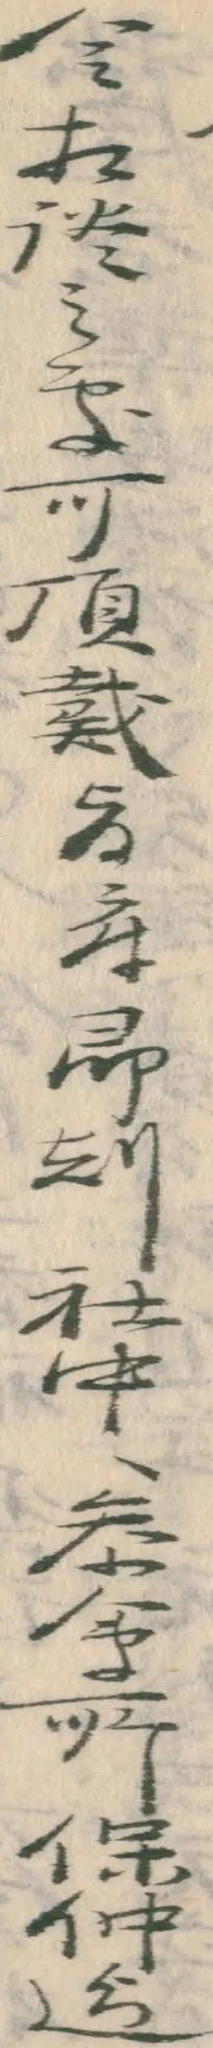令相談之處可頂戴旨ニ而即刻社中へ参會所保仲迄
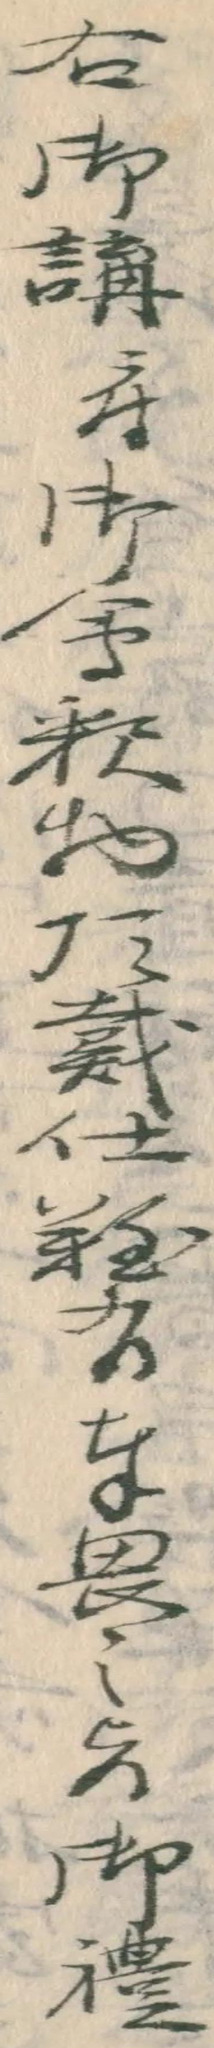右御講ニ付御会釈物頂戴仕難有奉畏之旨御礼
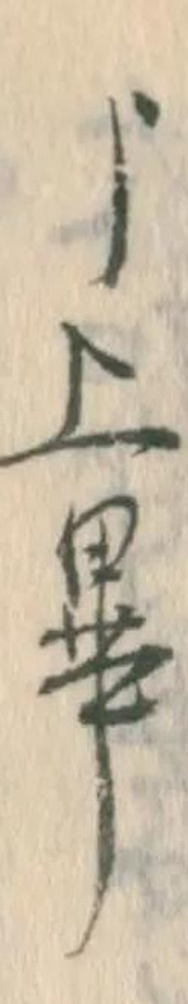申上畢
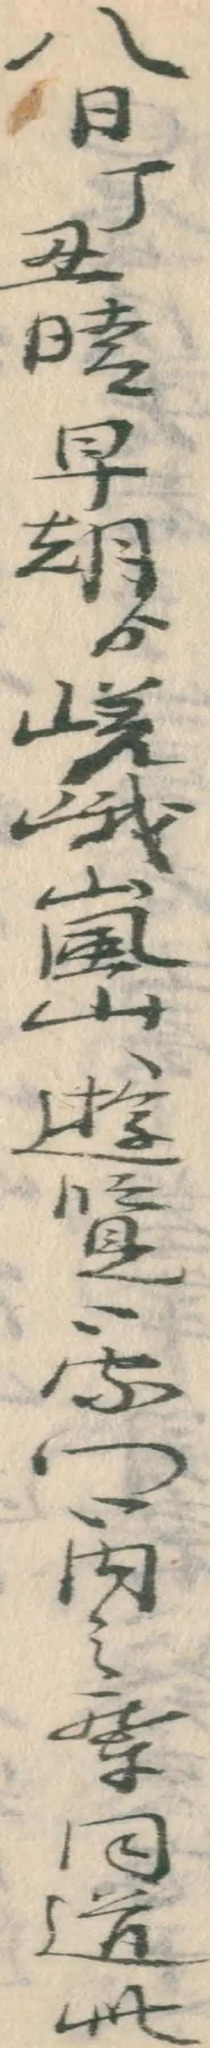八日丁丑晴早朝ゟ嵯峨嵐山へ遊覧御家門御内之輩同道此
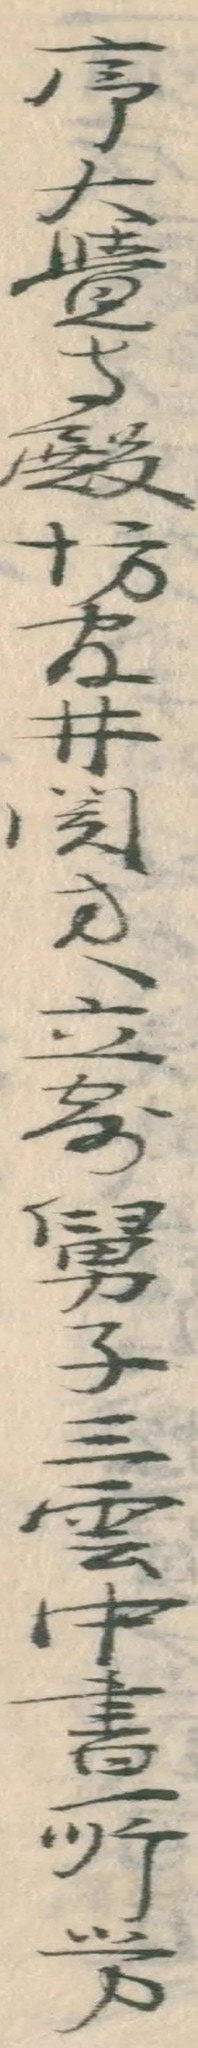序大覚寺殿坊官井関方へ立寄舅子三雲中書所労
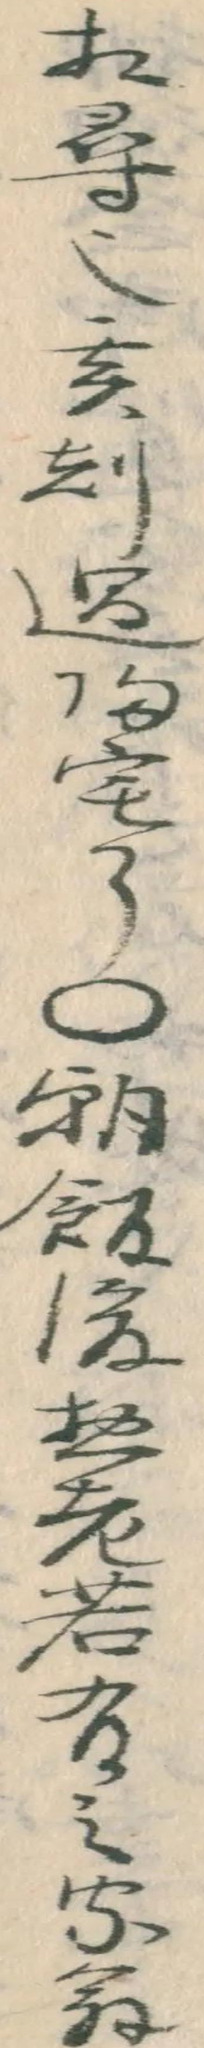相尋也亥刻過帰宅了〇朝飯後惣老若有之家翁
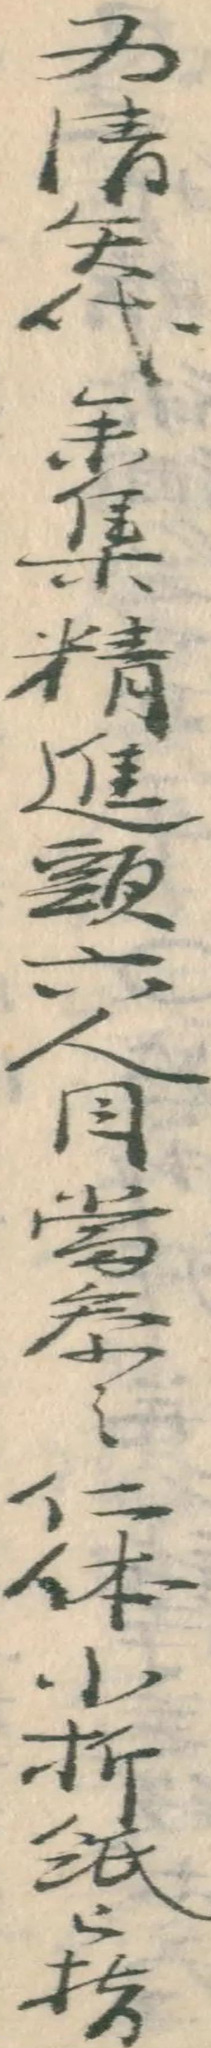為清矢代参集精進頭六人月当参之仁体小折紙被指
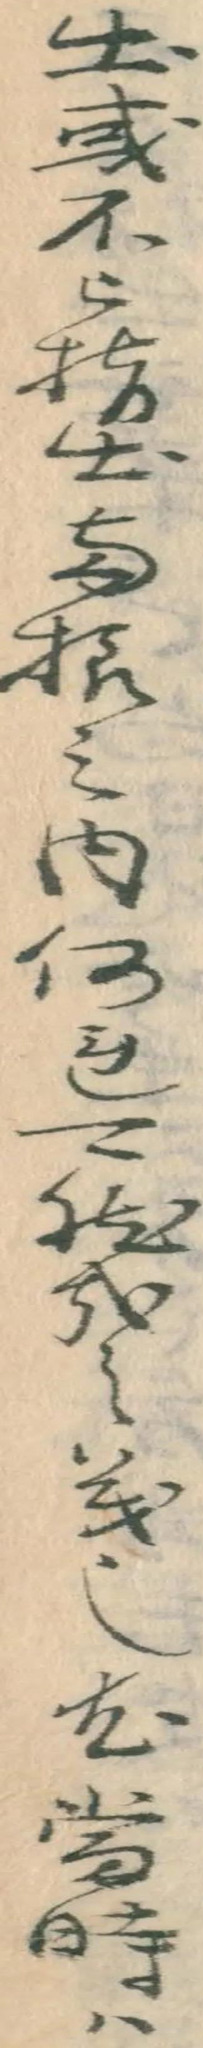出或不被指出両様之内何連可然哉之義也尤当時ハ
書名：賀茂社記録. 第64冊
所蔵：国立国会図書館 National Diet Library, JAPAN
